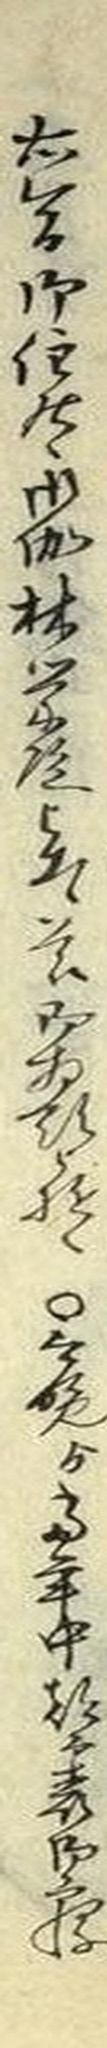右今日御住居へ御伽林栄殿被出候節御拝領被遊候〇今晩ゟ当年中都而表御寝
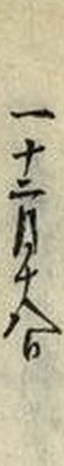一十二月十八日
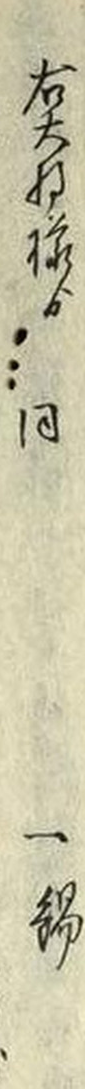右大将様ゟ同一鯣
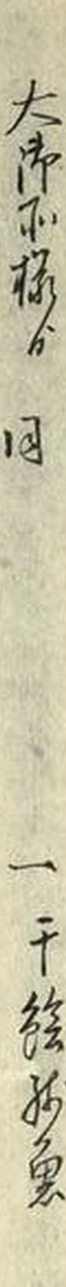大御所様ゟ同一干鱠残魚
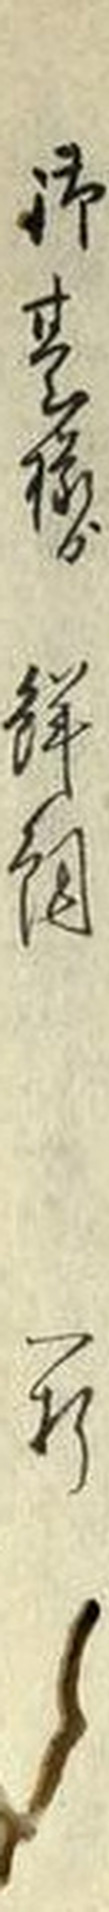御台様ゟ鮮鯛一折
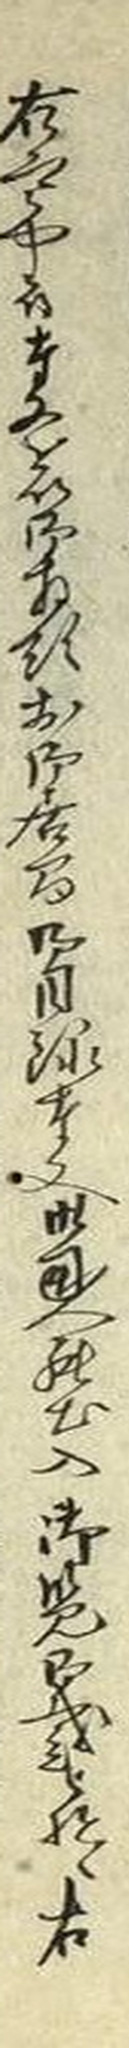右寒中ニ付奉文を以御拝領於御居間御目録奉文御用人罷出入御覧御戴被遊候右
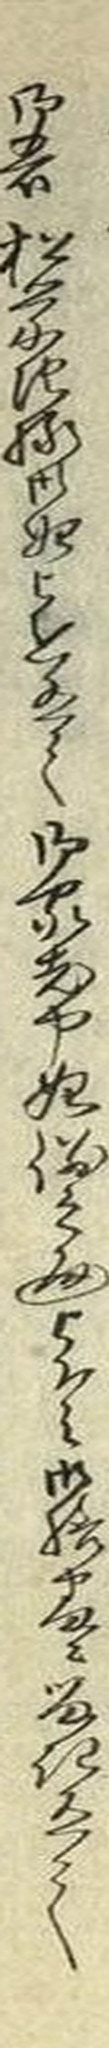御肴松栄院様御始被進有之御家老中始例之通被下之御膳番ニ留記有之
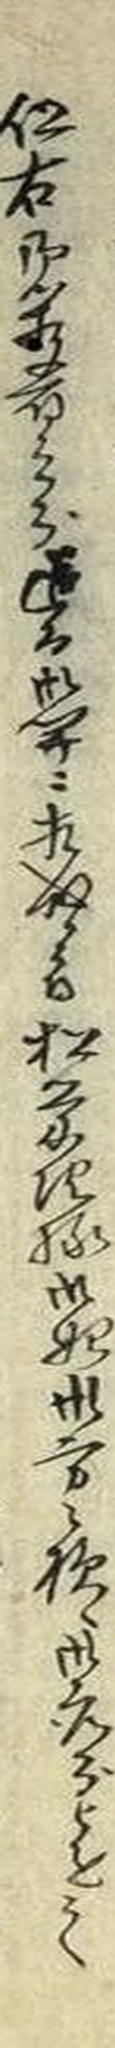但右御箱肴之分追而御開ニ相成候ニ付松栄院様御始御方々様へ御取分被進之
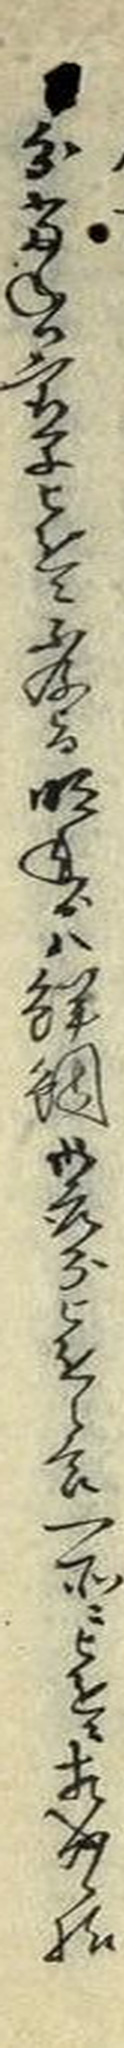分当年ハ最早被進ニ不及旨明年ゟハ鮮鯛御取分被進之節一所ニ被進ニ相成候様

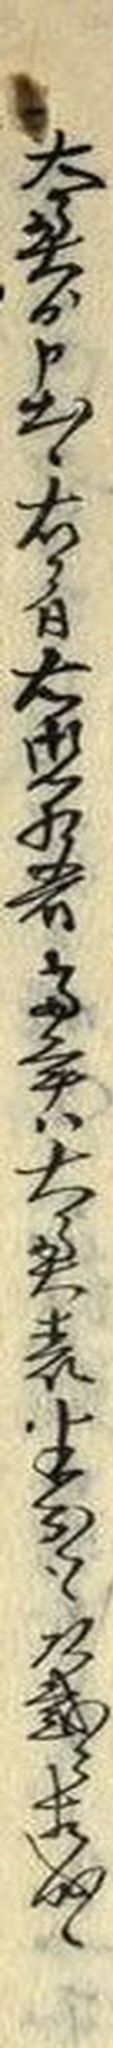大奥ゟ申出候右ニ付右御箱肴当年ハ大奥表半分ツヽ頂戴ニ相成候
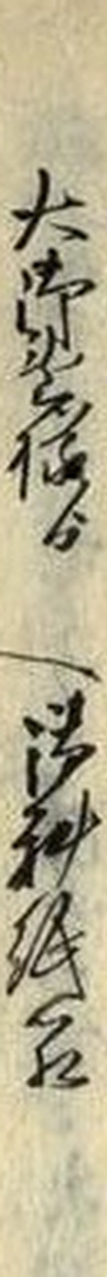大御台様ゟ御料紙箱一
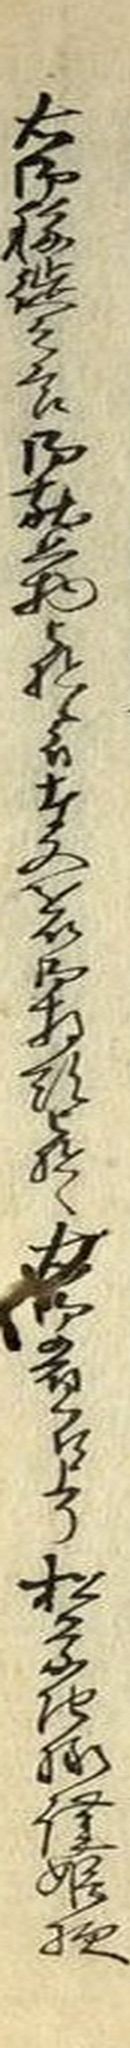右御移徒之節御献上物被遊候ニ付奉文を以御拝領被遊候右御肴召上り松栄院様謹姫様
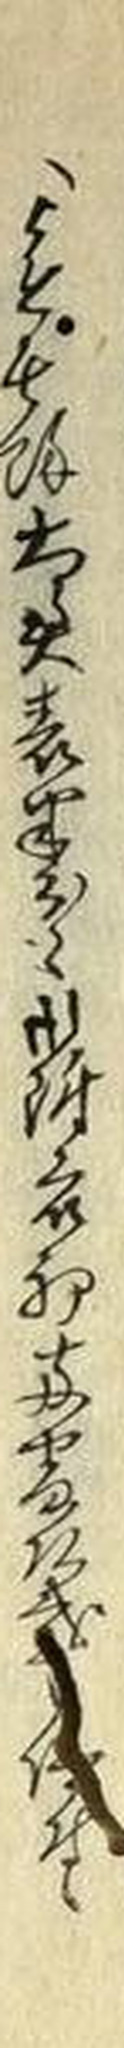へ被進其余大奥表半分ツヽ御附衆初両番頂戴被仰付候
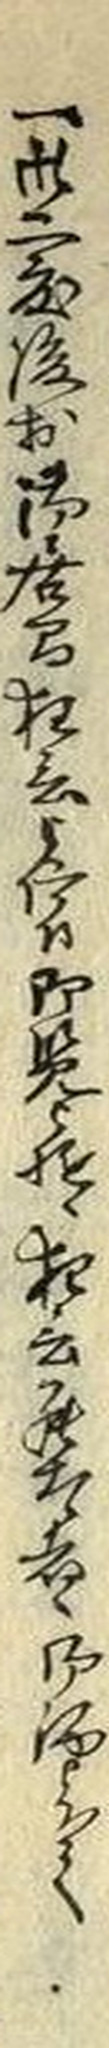一御二度後於御居間狂言被仰付御覧被遊候狂言罷出候者へ御酒被下之
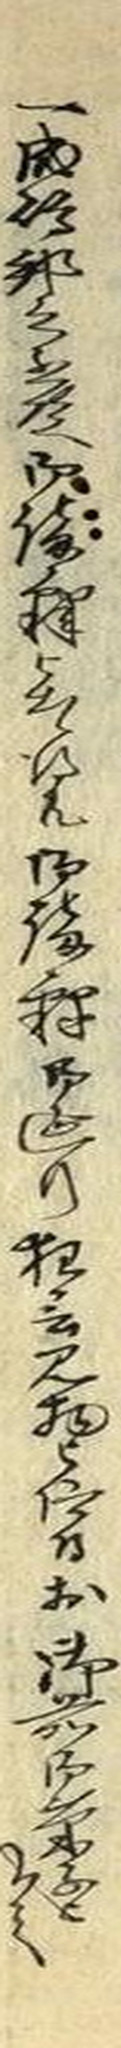一成嶋邦之丞殿御講釈被出候得共御講釈御延引狂言見物被仰付於御前御菓子被下之
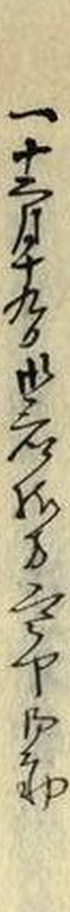一十二月十九日御三卿様方寒中御勤
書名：少傅日録抄（斉善付側向頭取日記、在府）
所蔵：福井県文書館 Fukui Prefectural Archives
